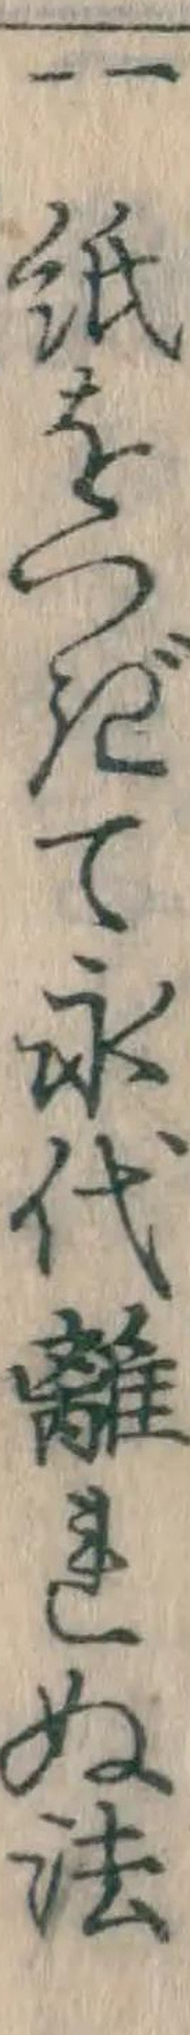一紙をつぎて永代離れぬ法
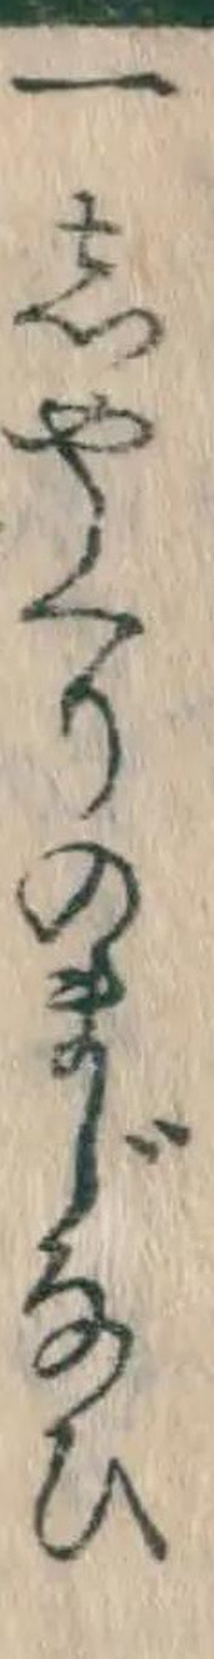一しやくりのまじなひ
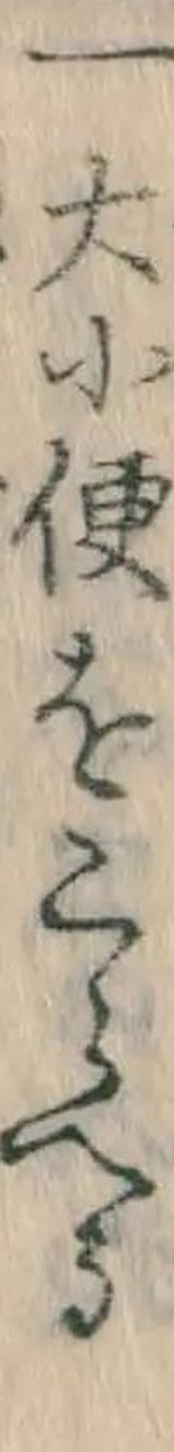一大小便をこらへる
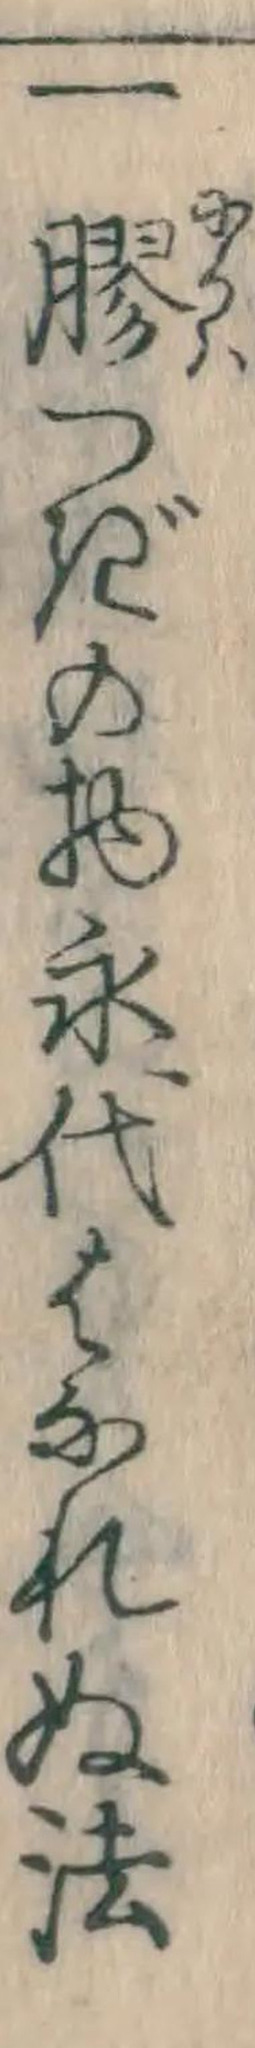一膠つぎの物永代はなれぬ法
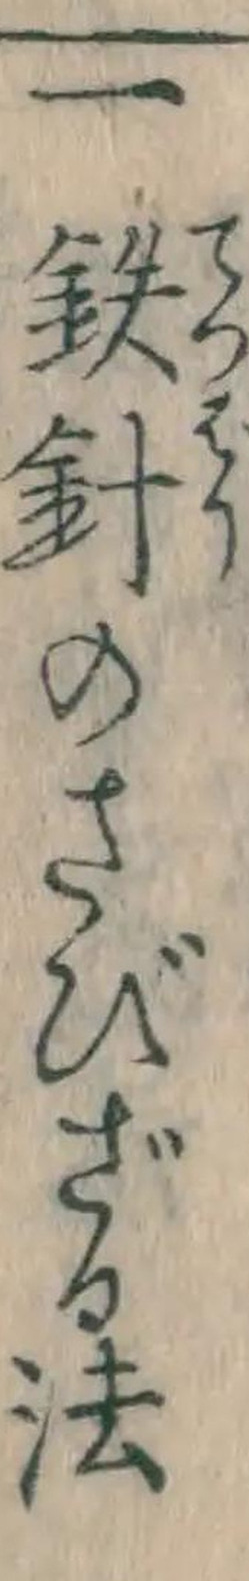一鉄針のさびざる法

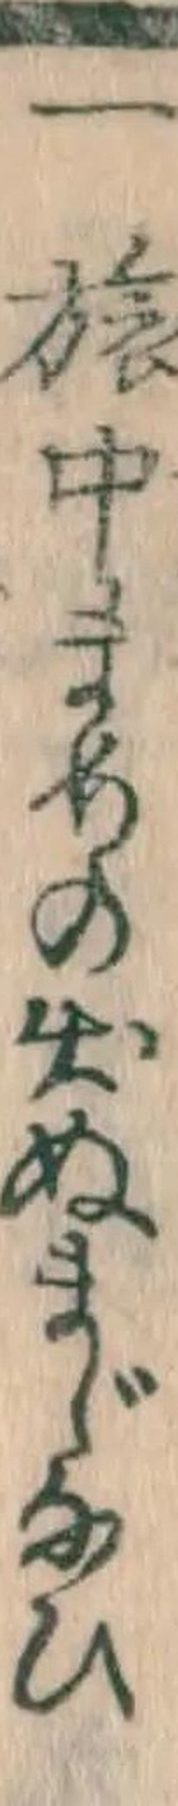一旅中まめの出ぬまじなひ
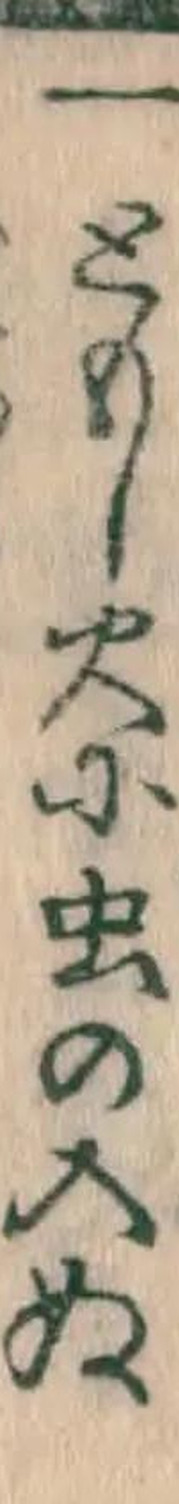一ともし火に虫の入ぬ
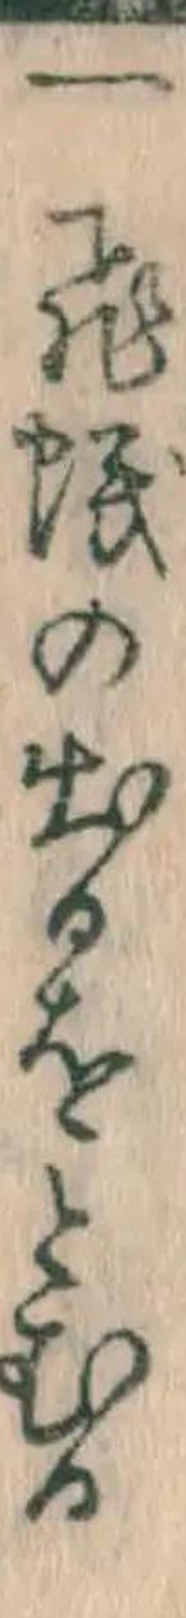一飛蟻の出るをとむる
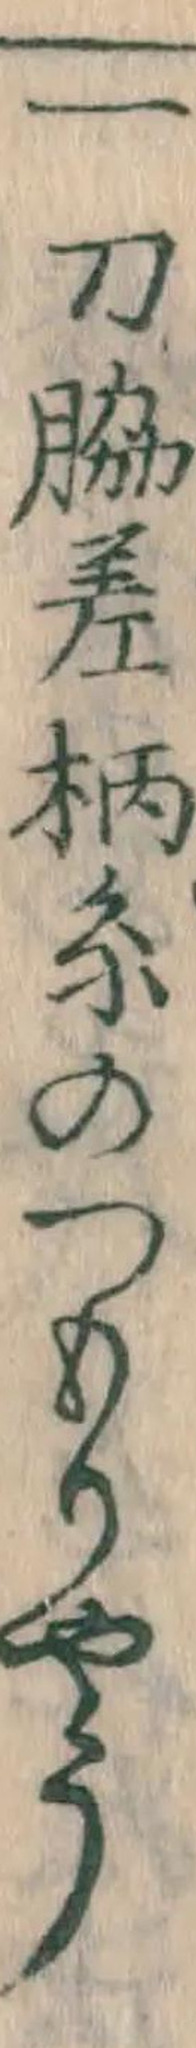一刀脇差柄糸のつもりやう
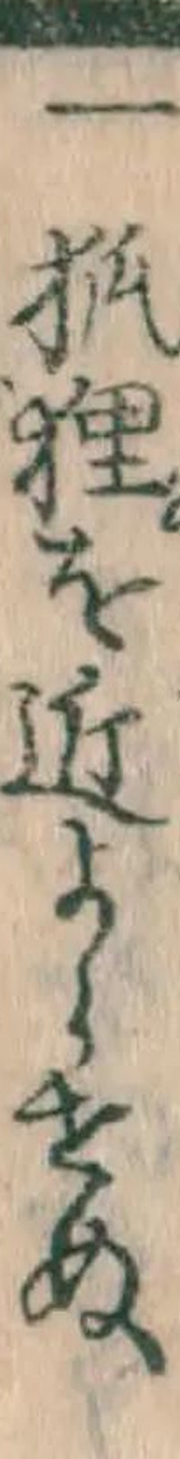一狐狸を近よらせぬ
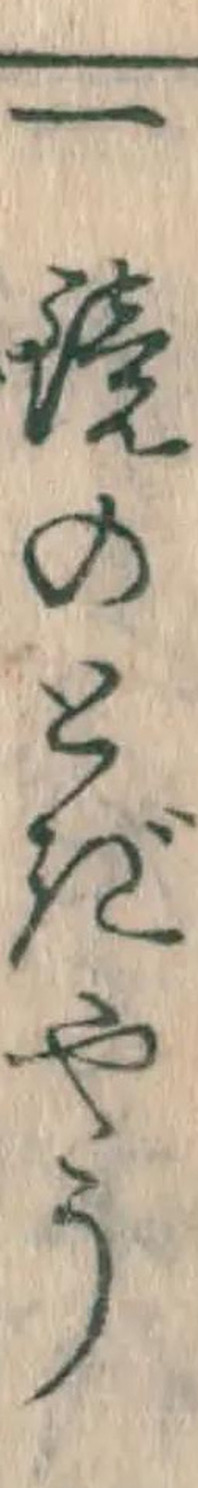一鏡のとぎやう
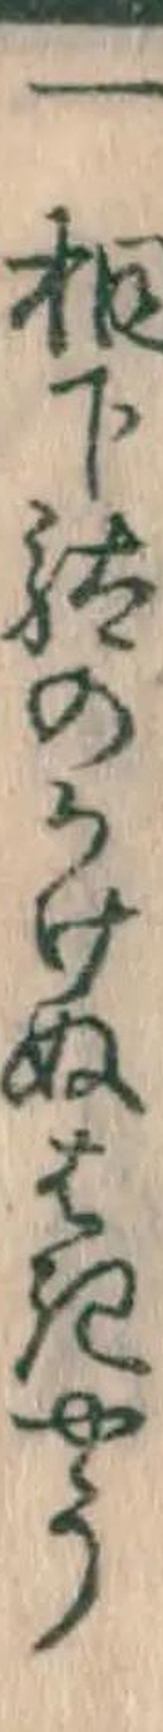一桐下駄のかけぬはきやう
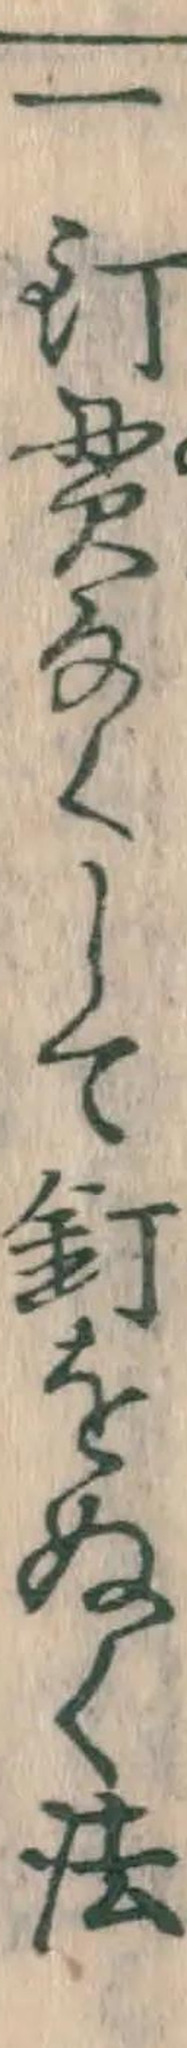一釘貫なくして釘をぬく法
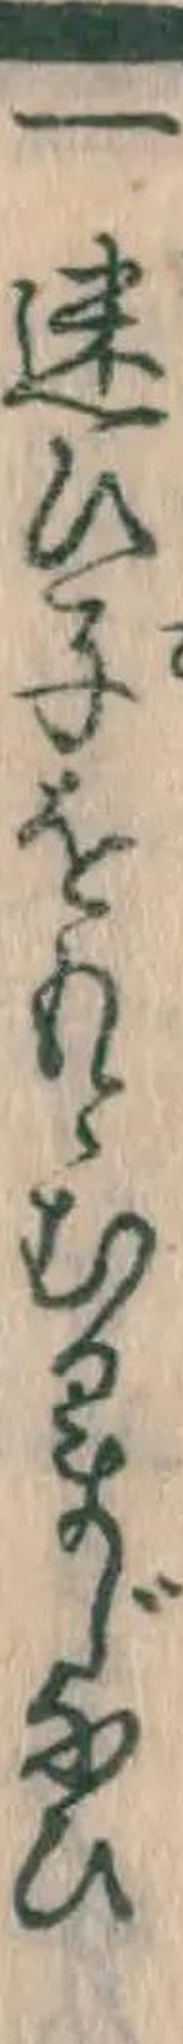一迷ひ子をもとむるまじなひ
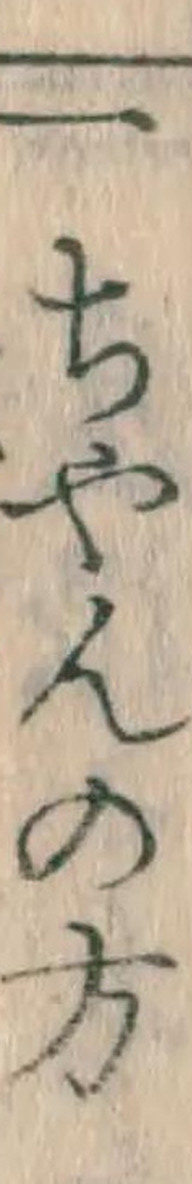一ちやんの方
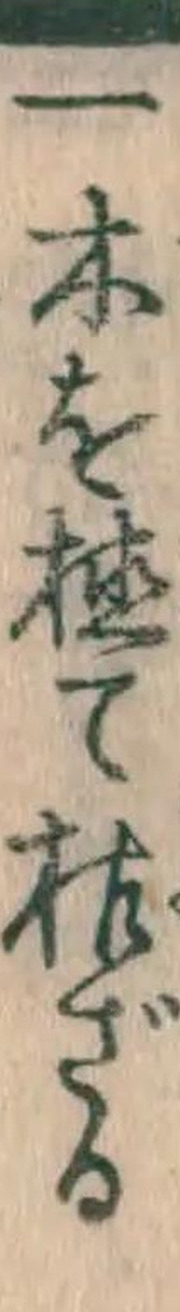一木を植て枯ざる
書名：広益秘事大全 3巻. [1]
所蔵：国立国会図書館 National Diet Library, JAPAN
